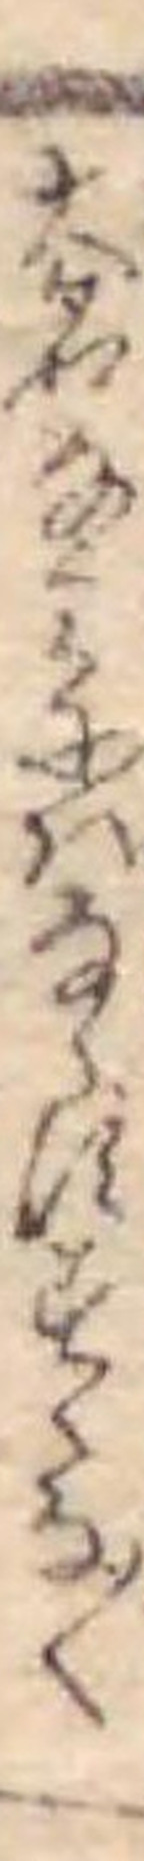大名なみにはならずすくなく
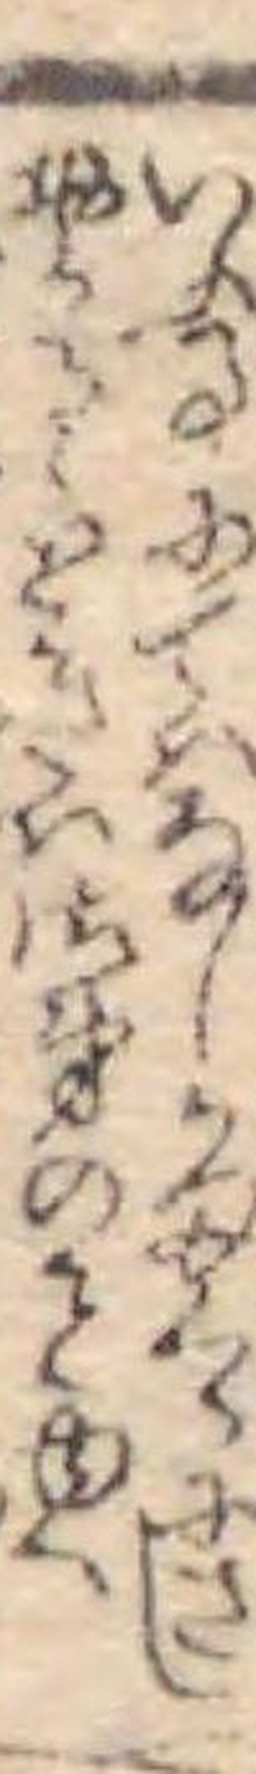おかるゝときは御弟のことゆへ
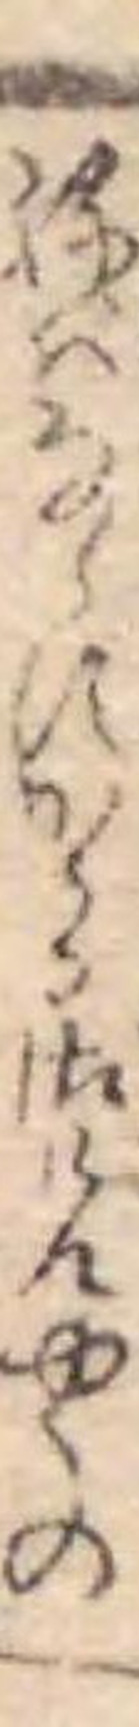ねはならすかゝる御けんやくの
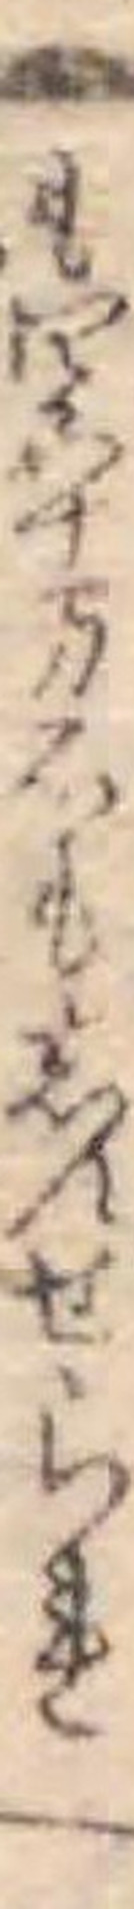も四五十万石もしんせられ
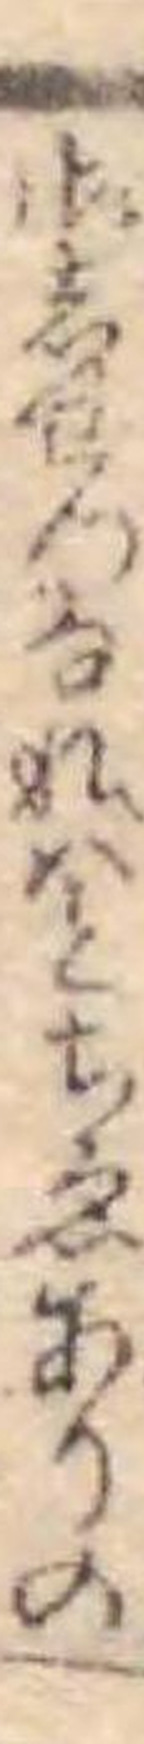御しせつなれはとちゑありの
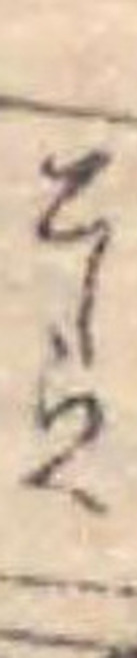こしらへ
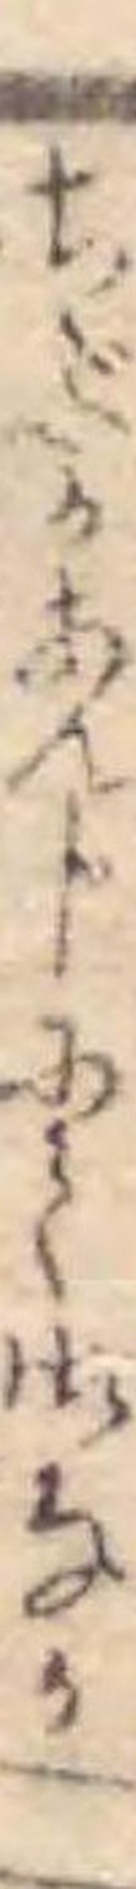ちゞふかあんじにて御なか
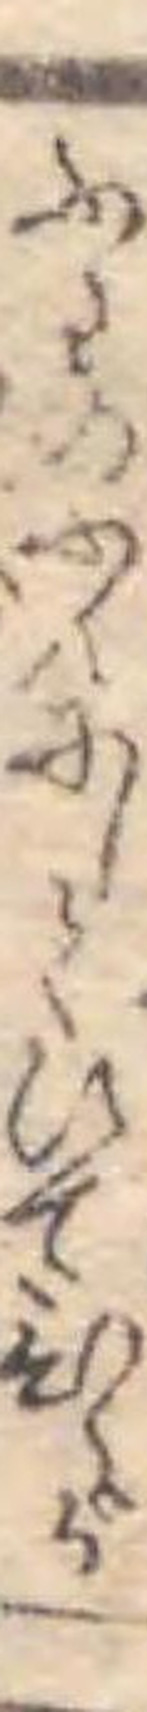ふわのふんにしてひでひらが
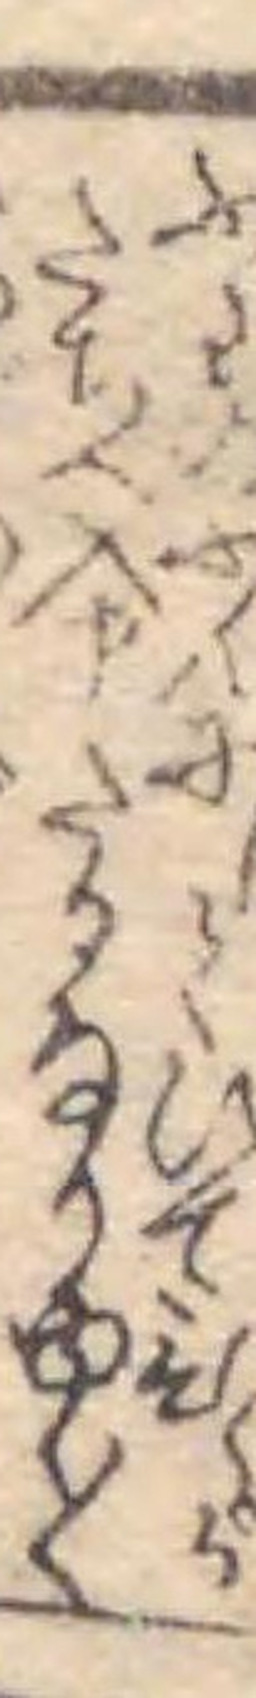たちへ入申たるなりゆく〳〵
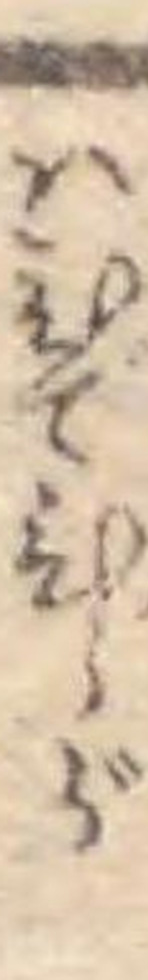はひでひらが
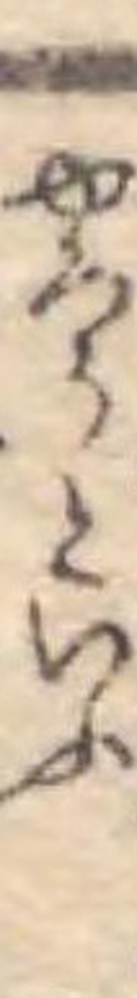やろうといふ
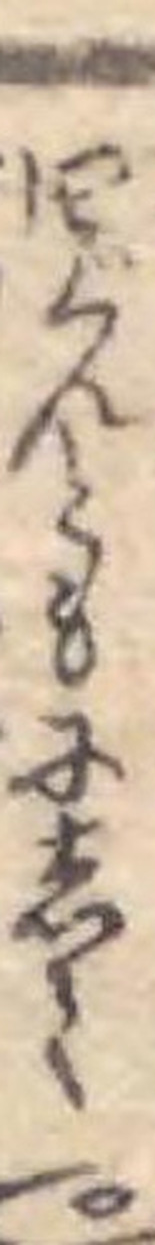四ぐんともにして
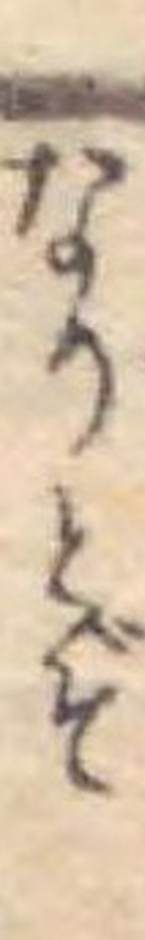なりとぞ
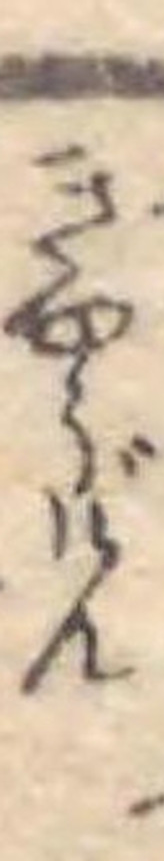きやうげん
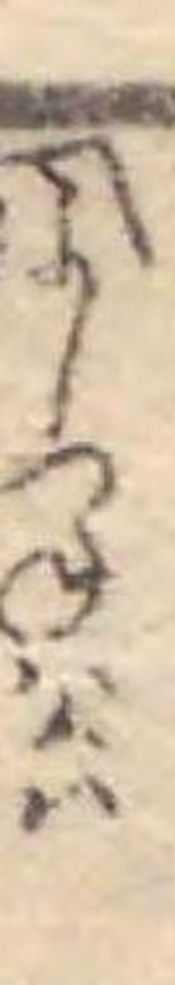〽よしつね公は
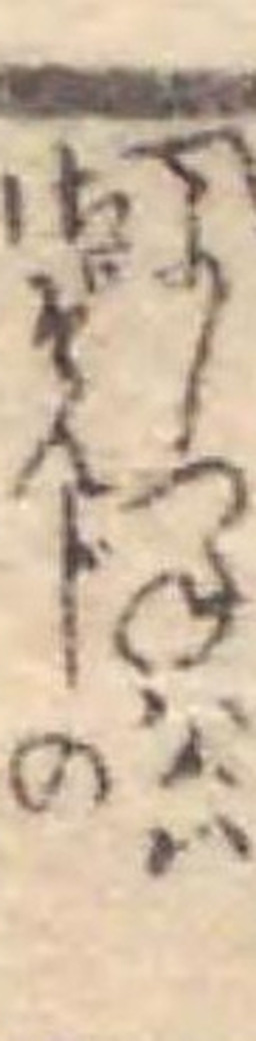御そんじの
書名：悦贔負蝦夷押領 : 3巻
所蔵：国立国会図書館 National Diet Library, JAPAN
